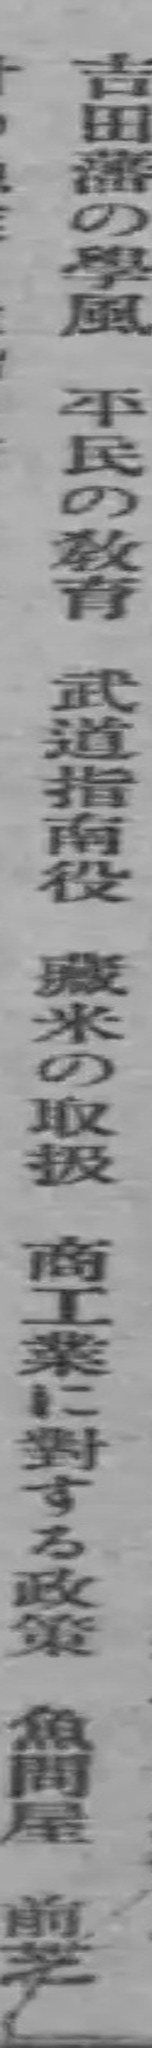吉田藩の学風平民の教育武道指南役蔵米の取扱商工業に対する政策魚問屋前芝
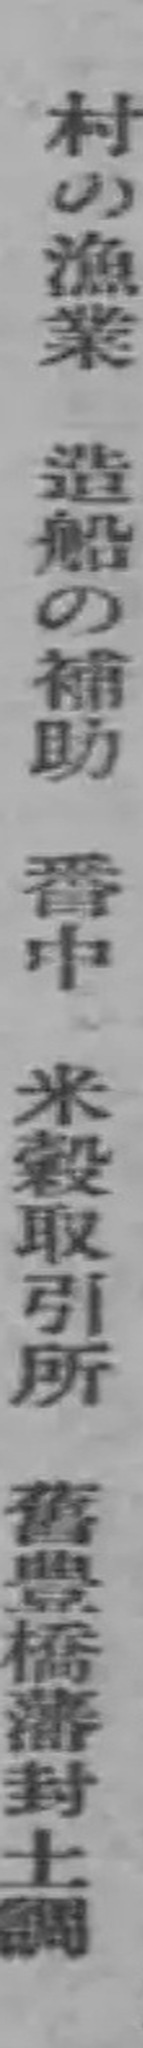村の漁業造船の補助番中米穀取引所旧豊橋藩封土調
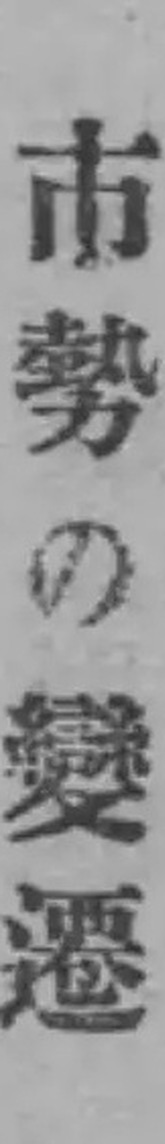市勢の変遷
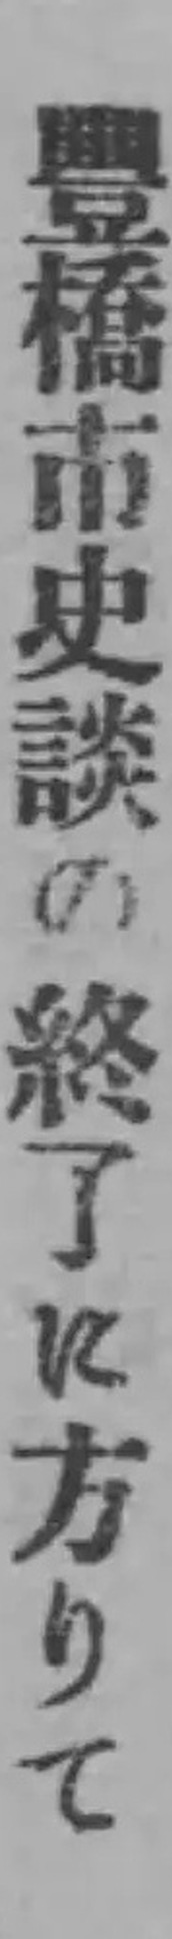豊橋市史談の終了に方りて
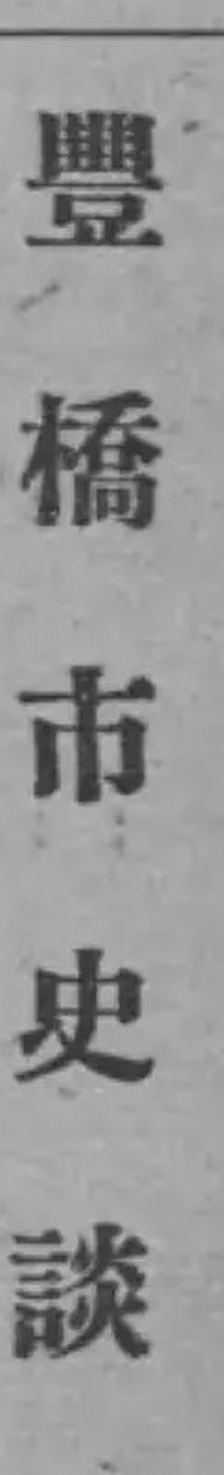豊橋市史談
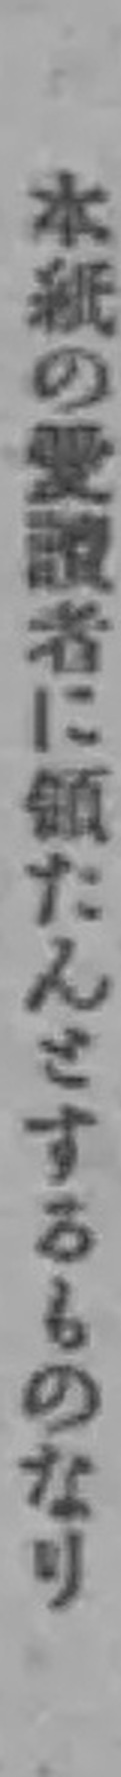本紙の受講者に領たんとするものなり
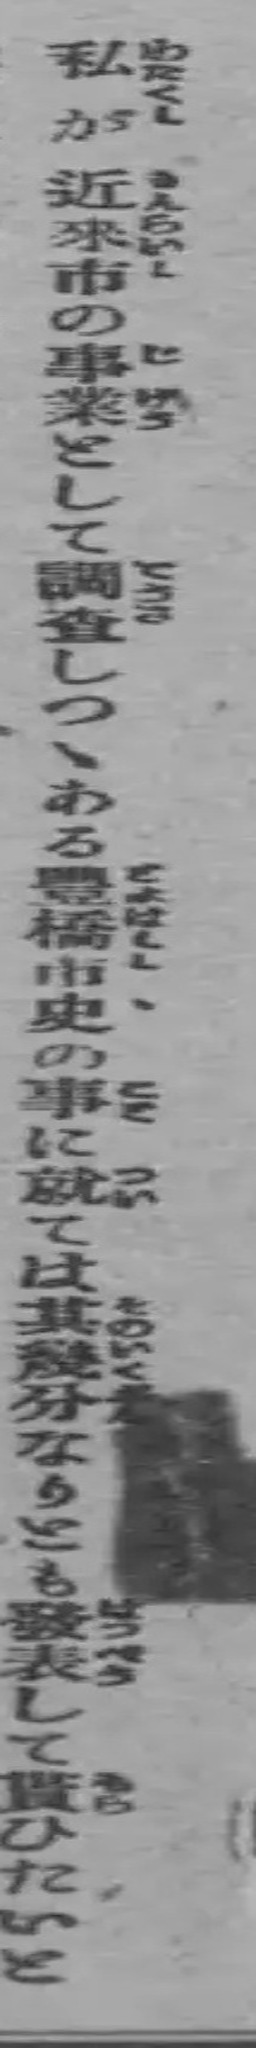私が近来市の事業として調査しつゝある豊橋市史の事に就ては其幾分なりとも発表して貰ひたいと
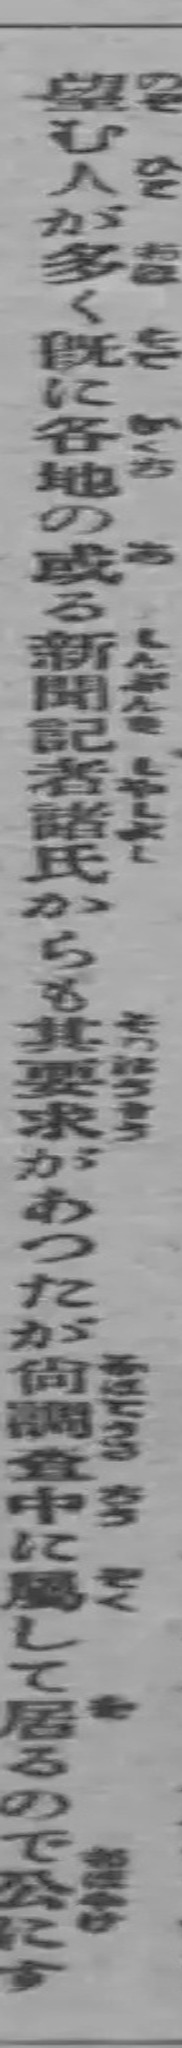望む人が多く既に各地の或る新聞記者諸氏から其要求があつたが尚調査中に属して居るので公にす
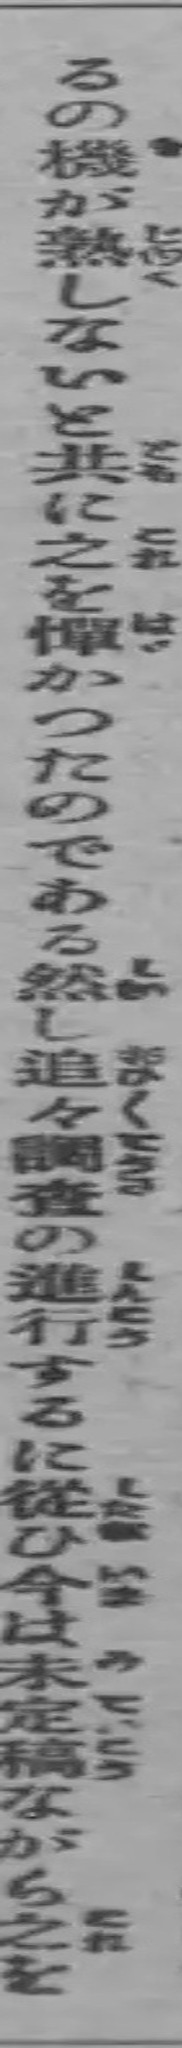るの機が熟しないと共に之を憚かつたのである然し追々調査の進行するに従ひ今は未定稿ながら之を
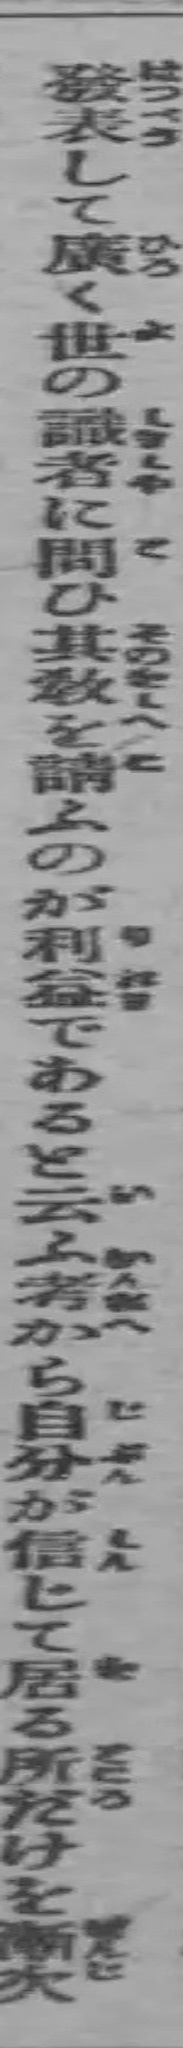発表して広く世の識者に問ひ其教を請ふのが利益であると云ふ考から自分が信じて居る所だけを漸次
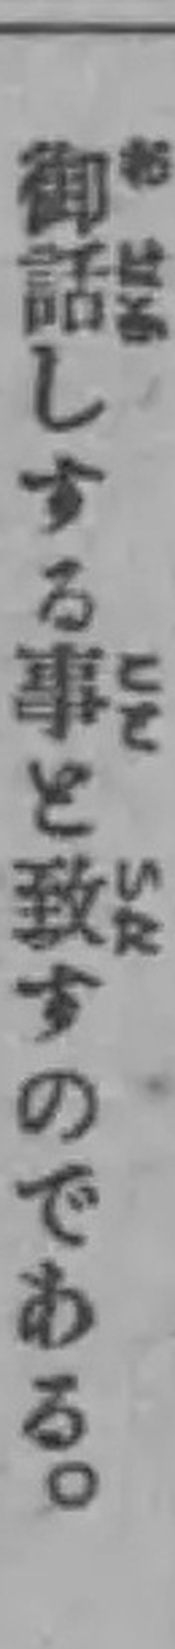御話しする事と致すのである。
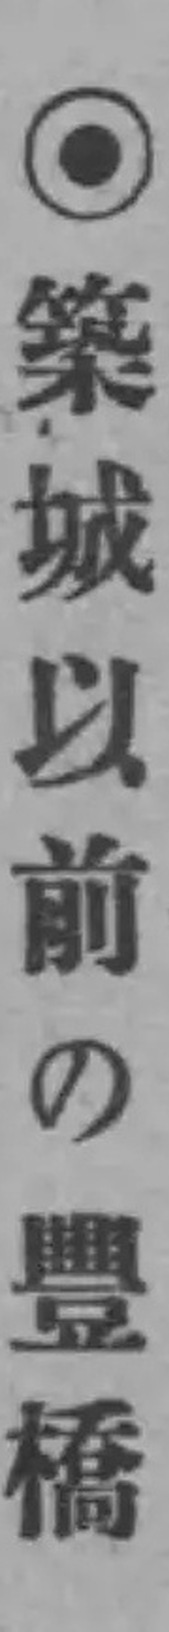⦿築城以前の豊橋
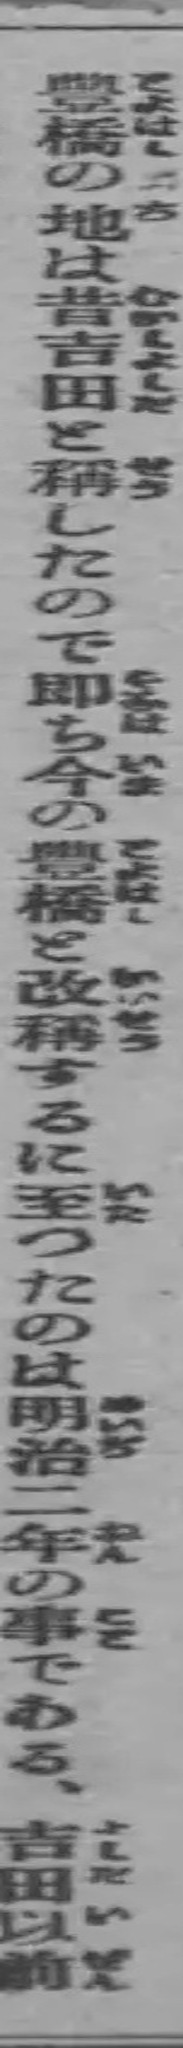豊橋の地は昔吉田と称したので即ち今の豊橋と改称するに至つたのは明治二年の事である、吉田以前
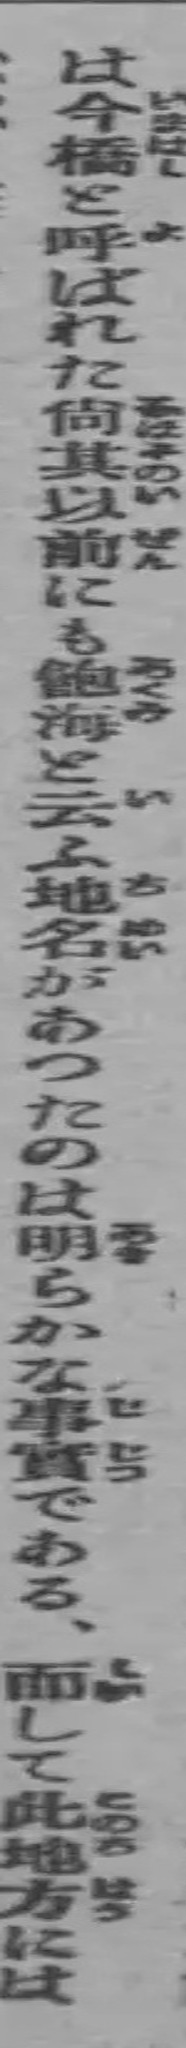は今橋と呼ばれた尚其以前にも飽海と云ふ地名があつたのは明らかな事実である、而して此地方には
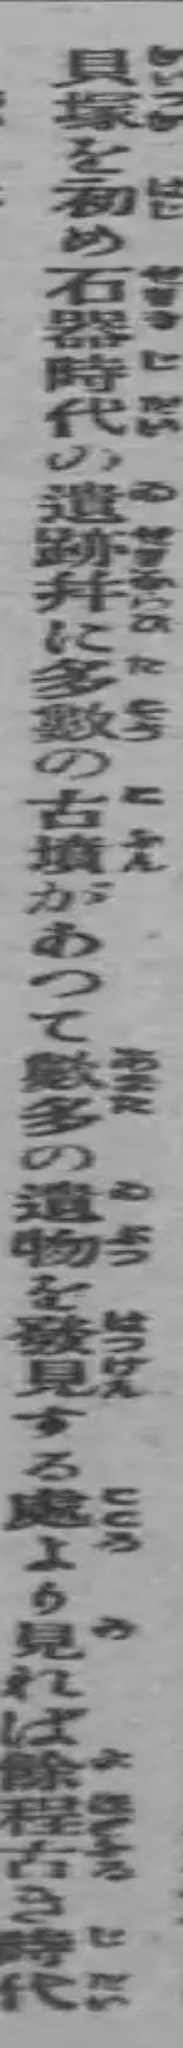貝塚を初め石器時代の遺跡幷に多数の古墳があつて数多の遺物を発見する処より見れば余程古き時代
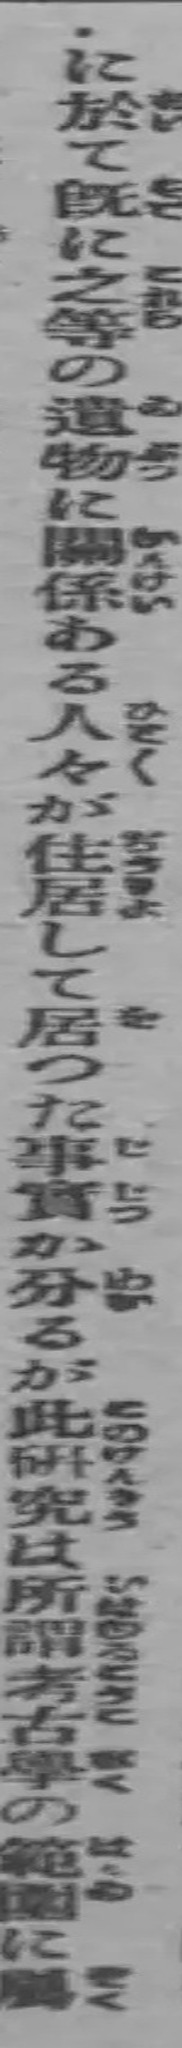に於て既に之等の遺物に関係ある人々が住居して居つた事実が分るが此研究は所謂考古学の範囲に属
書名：豊橋市史談
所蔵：国立国会図書館 National Diet Library, JAPAN
